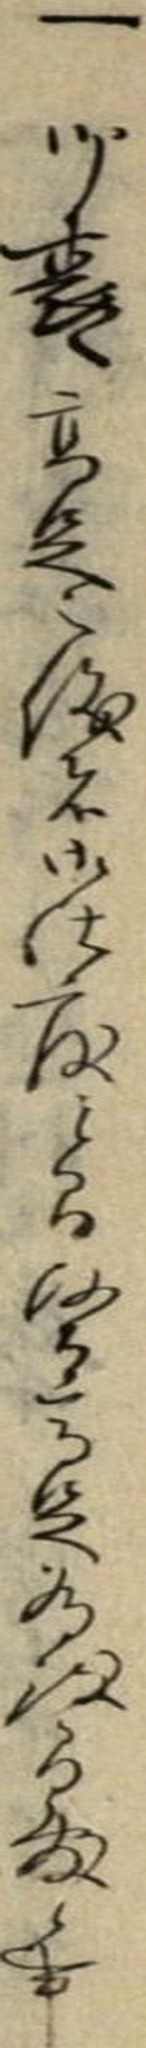一御裏高足之儀は御法度に候間堅高足為致間敷候事
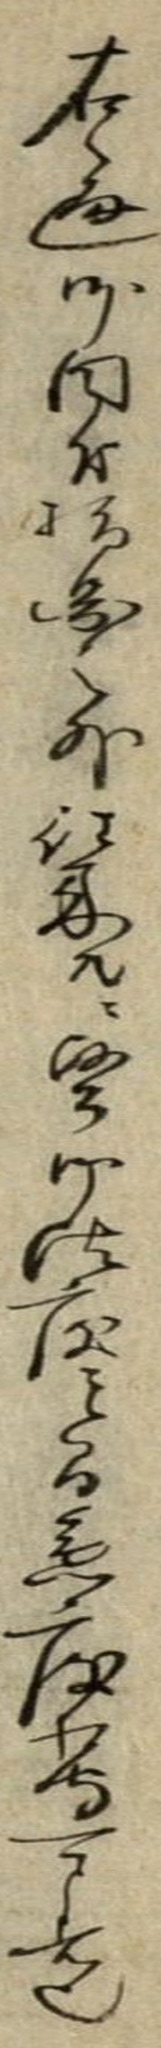右之通御目付指図之外往来共に堅御法度に候間急度相守可申者也
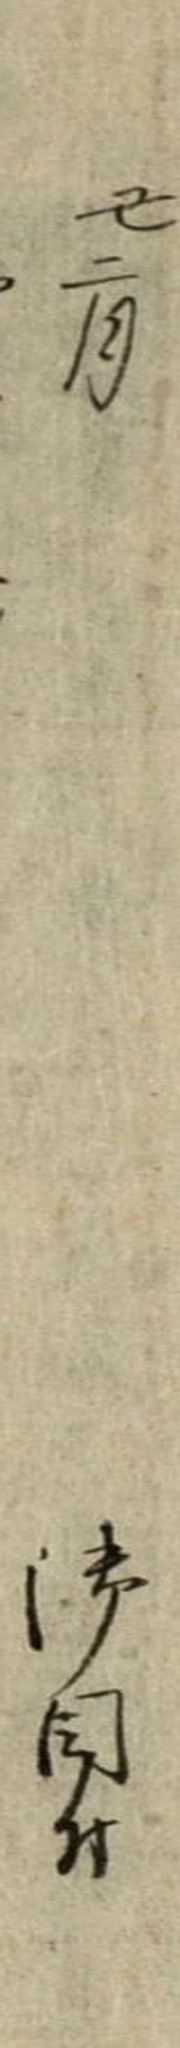丑二月御目付
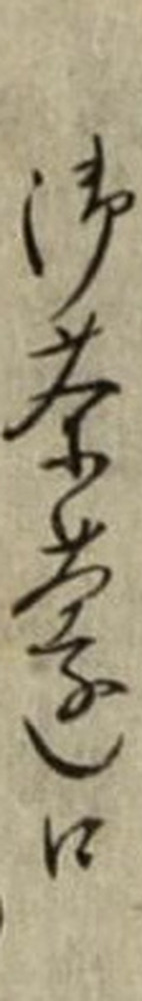御茶園口
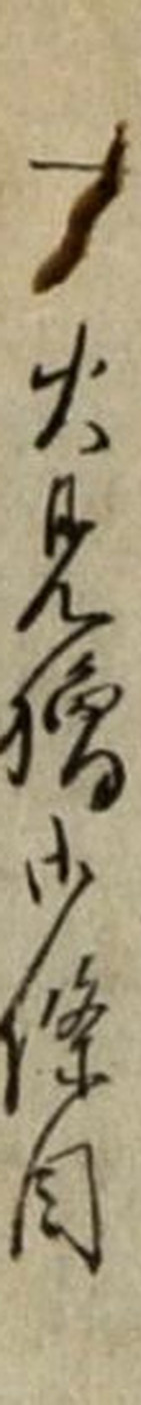一火見櫓御條目
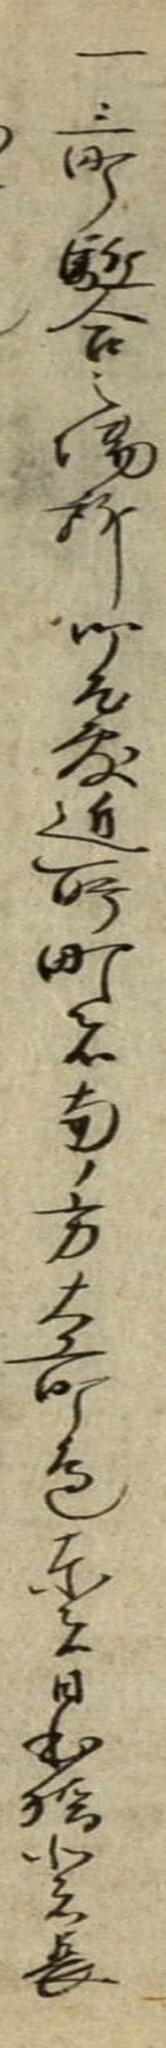一三町駆合之場所御屋敷近所町は南の方大工町辺東は日本橋北は長
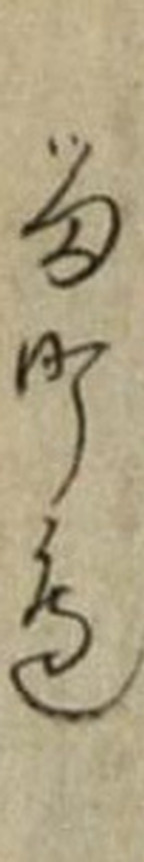留町辺
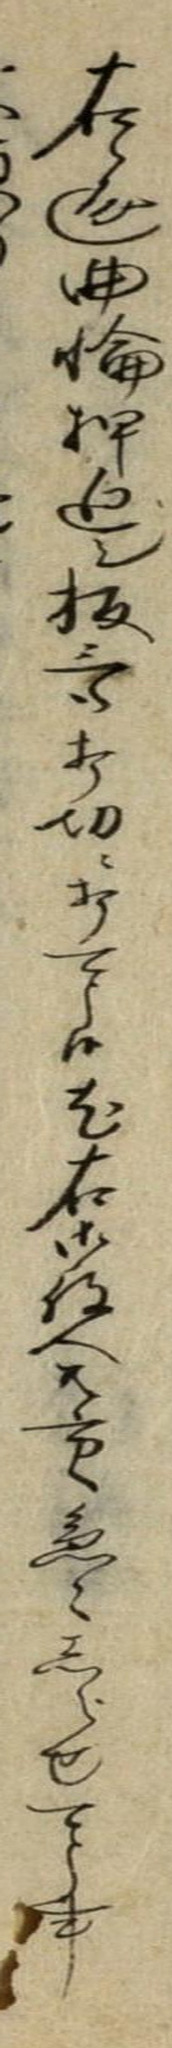右之通曲輪押廻し板三ツ打切に打可申候尤右御役人共方へ急々しらせ可申事
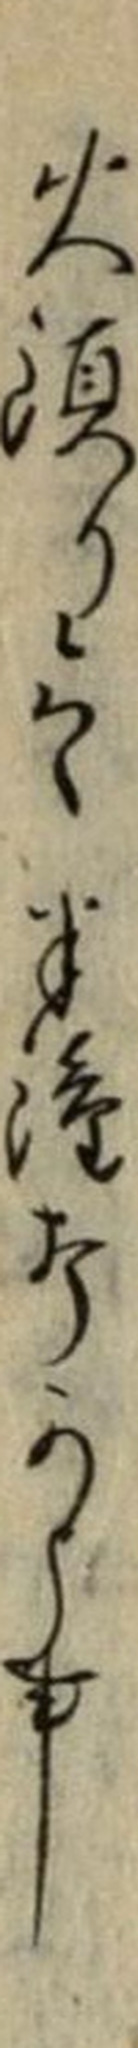火鎮り候はゝ半鐘打可申事
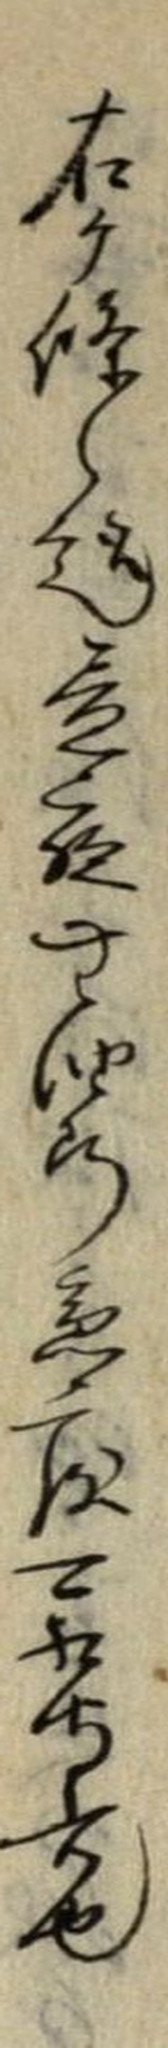右ケ條之趣昼夜無油断急度可相守者也
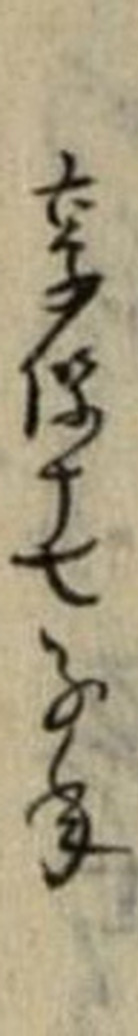享保十七子年
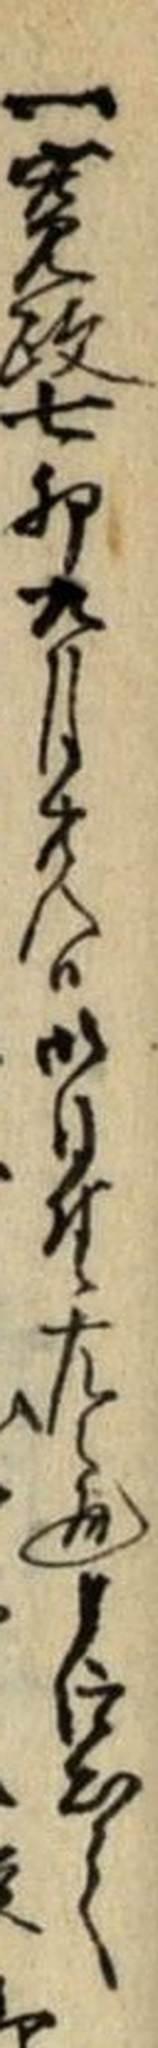一寛政七卯九月廿八日御目付へ左之通被仰出之
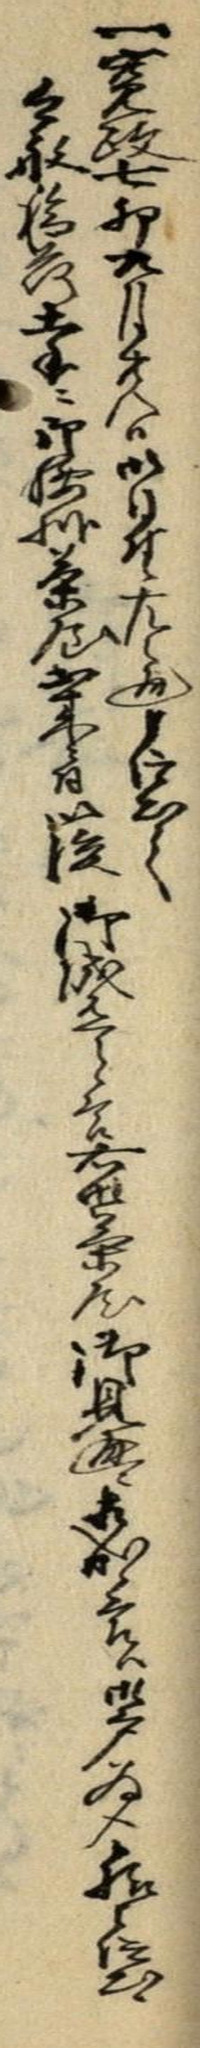今般稲荷土手に御腰掛茶屋出来に付以後御成有之候節右御茶屋御見通に相成候節は御戸為〆候様被仰出候

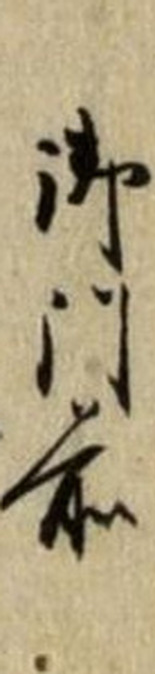御門前
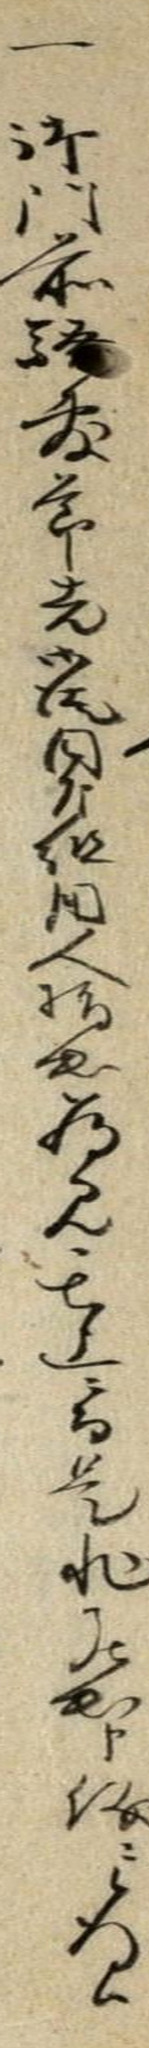一御門前騒敷節先御徒目付組用人指出為見其上ニ而是非罷出申儀ニ候得ハ
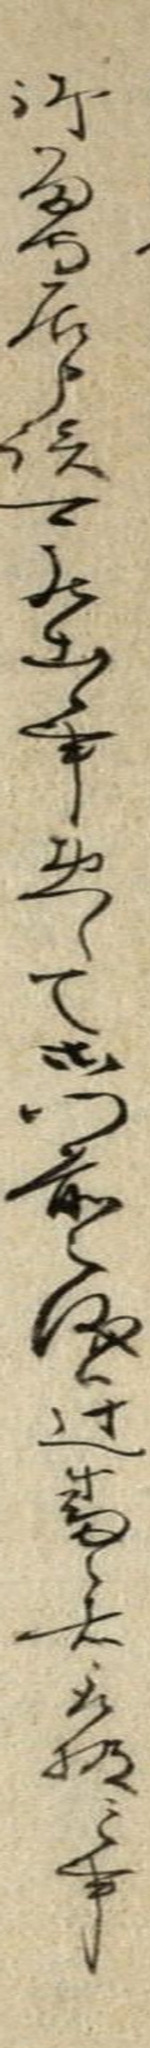御留守居申談可罷出候事惣して御門前之儀ハ辻番之者取扱之事
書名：三都并道中之部
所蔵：福井県文書館 Fukui Prefectural Archives
